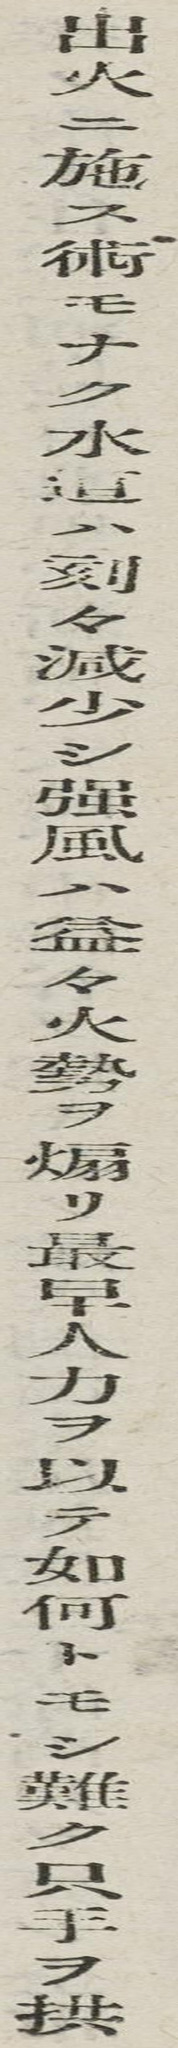出火ニ施ス術モナク水道ハ刻々現象シ強風ハ益々火勢ヲ煽リ最早人力ヲ以テ如何トモシ難ク只手ヲ拱
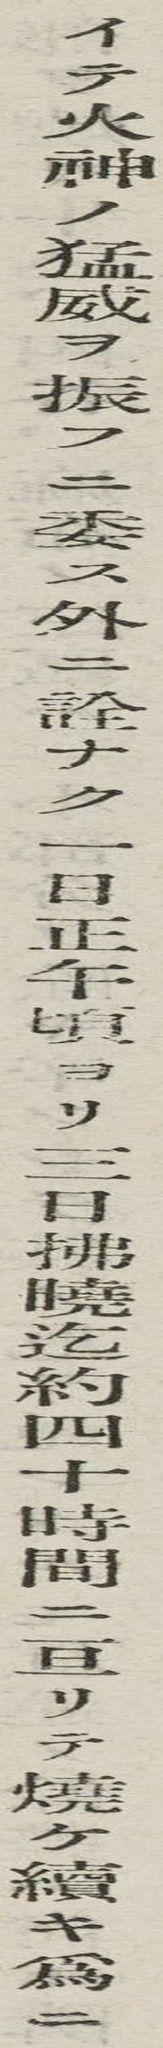イテ火神ノ猛威ヲ振フニ委ス外ニ詮ナク一日正午頃ヨリ三日拂暁迄約四十時間ニ亘リテ焼ケ続キ為ニ
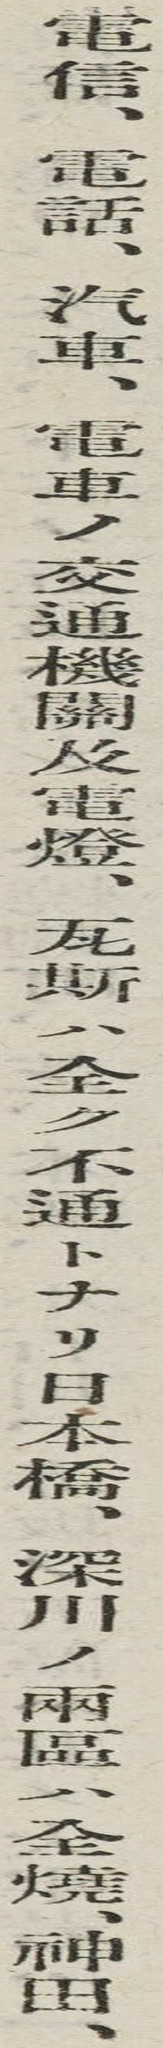電信、電話、汽車、電車ノ交通機関及電灯、瓦斯ハ全ク不通トナリ日本橋、深川ノ両区ハ全焼、神田、

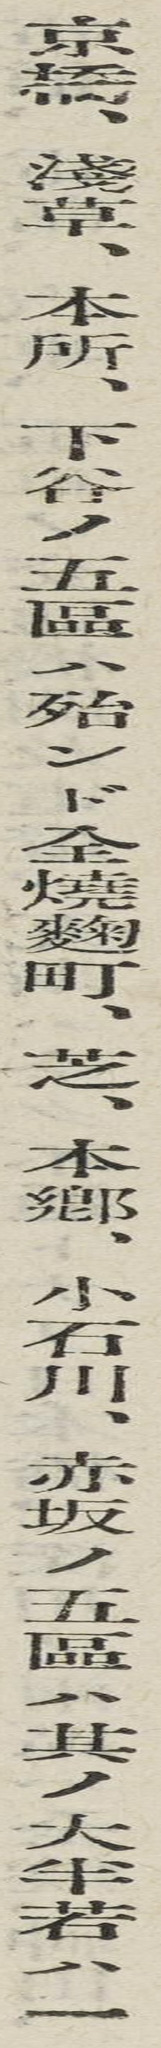京橋、浅草、本所、下谷ノ五区ハ殆ンド全焼麹町、芝、本郷、小石川、赤坂ノ五区ハ其ノ大半若ハ一
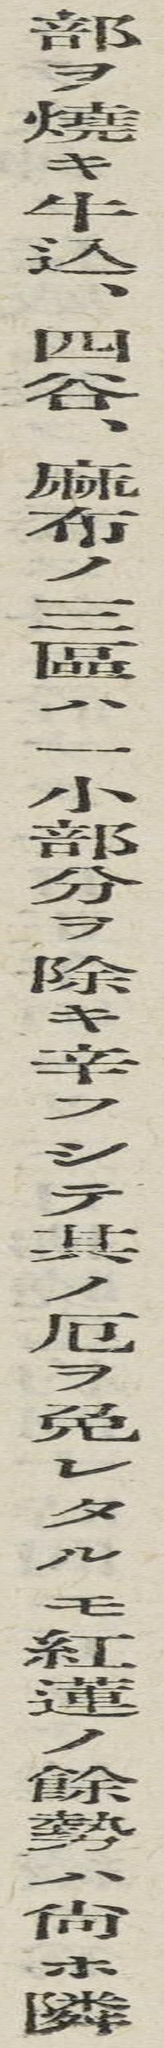部ヲ焼キ牛込、四谷、麻生ノ三区ハ一小部分ヲ除キ辛フシテ其ノ厄ヲ免レタルモ紅蓮ノ余勢ハ尚ホ隣
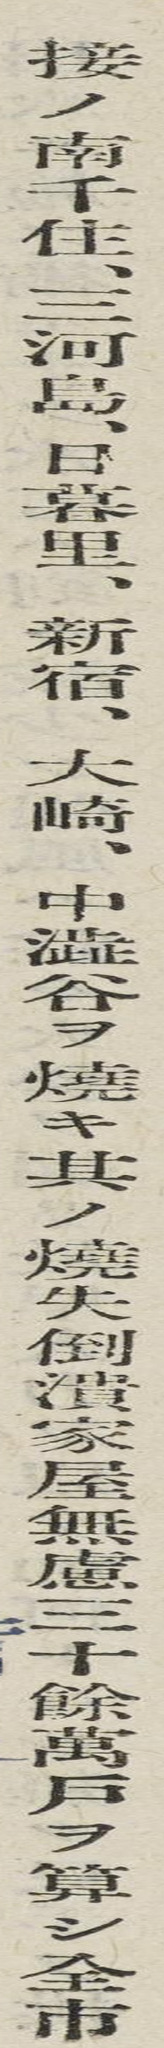接ノ南千住、三河島、日暮里、新宿、大崎、中渋谷ヲ焼キ其ノ焼失倒潰家屋無慮三十余万戸ヲ算シ全市
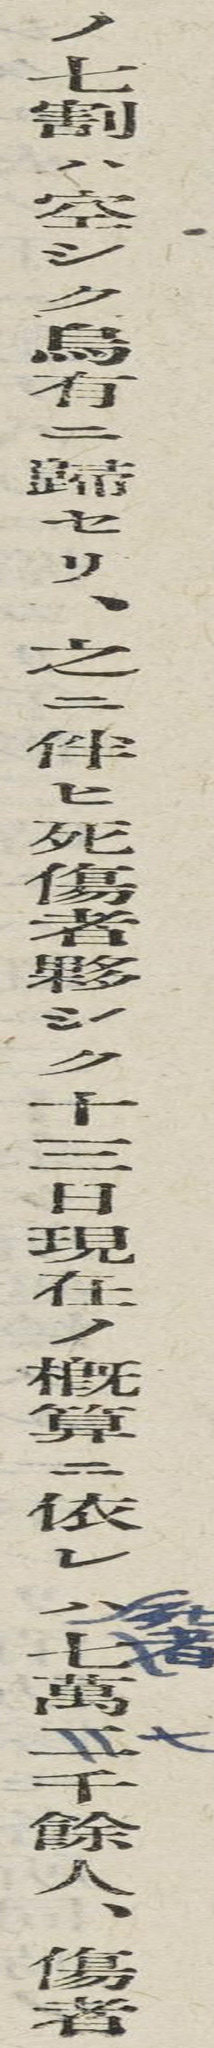ノ七割ハ空シク鳥有ニ帰セリ、之ニ伴ヒ死傷者夥シク十三日現在ノ概算ニ依レハ七万
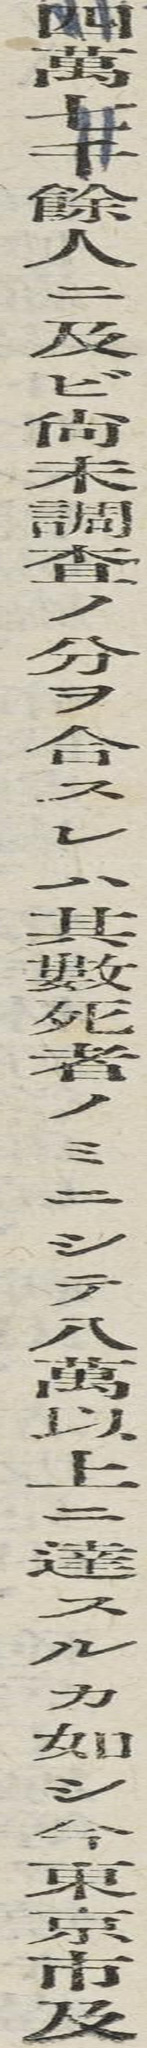万余人ニ及ビ尚未調査ノ分ヲ合スレハ其数死者ノミニシテ八万以上ニ達スルカ如シ今東京市及
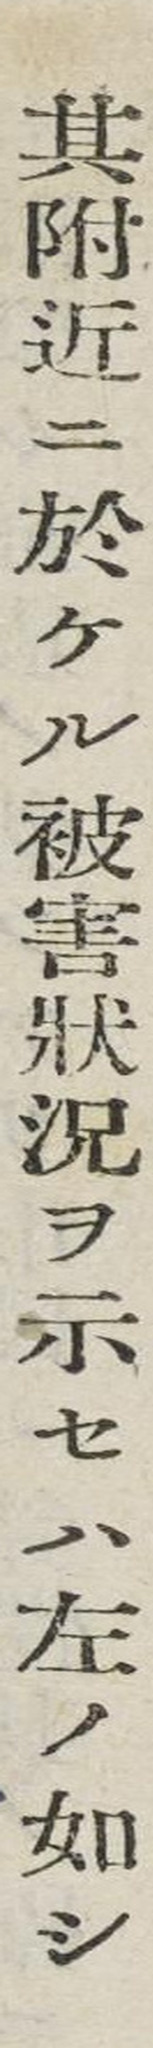其附近ニ於ケル被害状況ヲ示セハ左ノ如シ
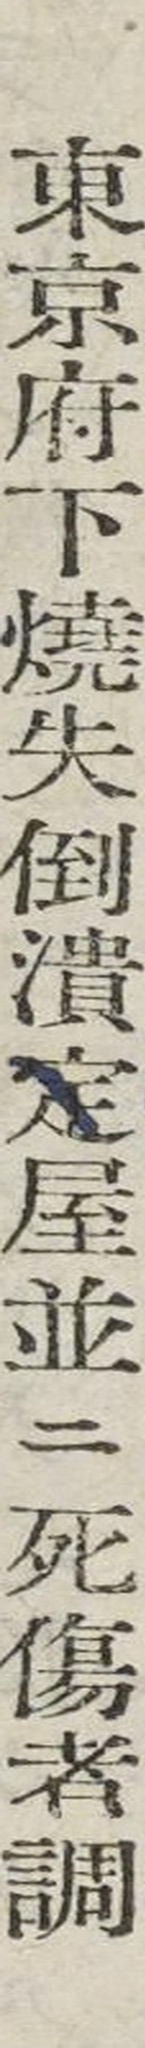東京府下焼失倒潰屋並ニ死傷者調
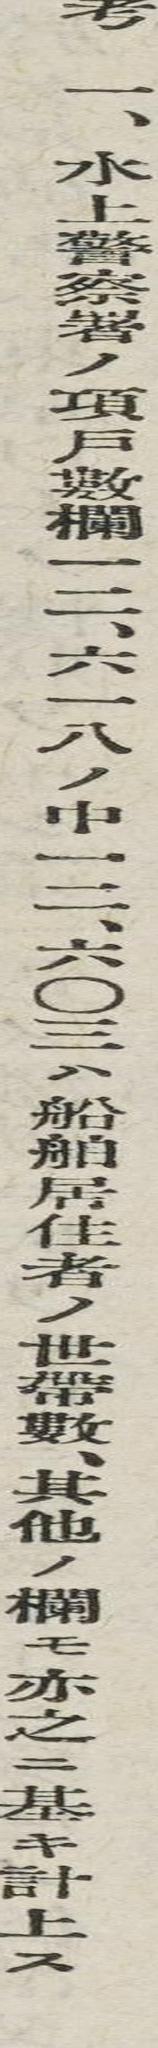備考一、水上警察署ノ項戸数欄一二、六一八ノ中一二、六〇三ハ船舶居住者ノ世帯数、其他ノ欄モ亦之ニ基キ計上ス
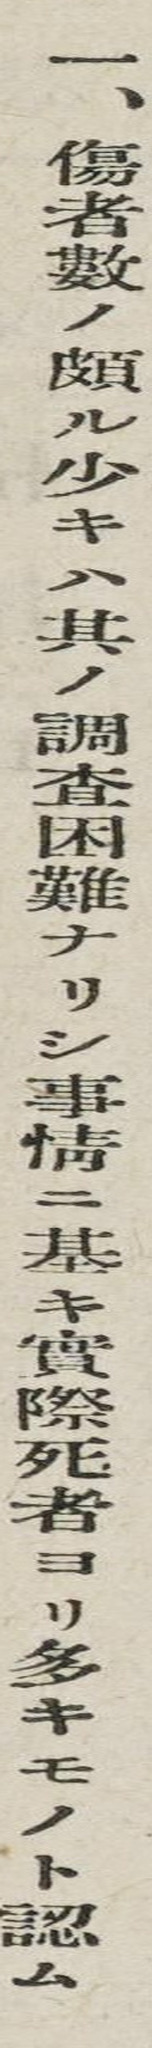一、傷者数ノ頗ル少キハ其ノ調査困難ナリシ事情ニ基キ実際死者ヨリ多キモノト認ム
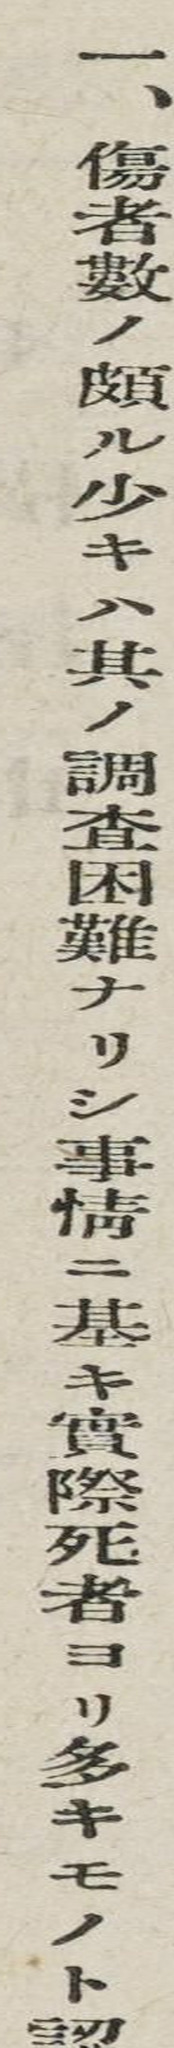一、傷者数ノ頗ル少キハ其ノ調査困難ナリシ事情ニ基キ実際死者ヨリ多キモノト認ム
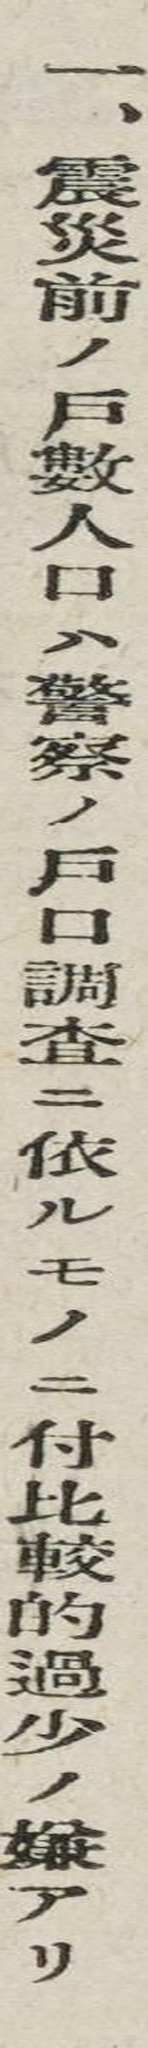一、震災前ノ戸数人口ハ警察ノ戸口調査ニ依ルモノニ付比較的過少ノ嫌アリ

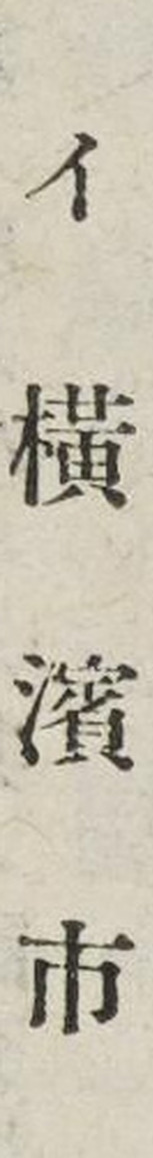イ横浜市
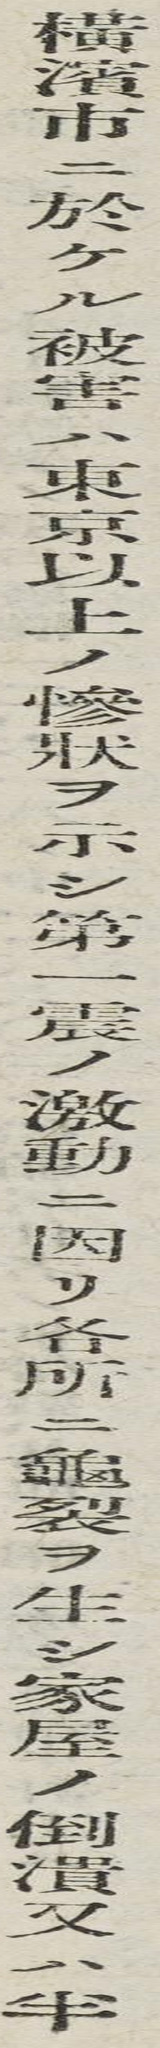横浜市ニ於ケル被害ハ東京以上ノ惨状ヲ示シ第一震ノ激動ニ因リ各所ニ亀裂ヲ生シ家屋ノ倒潰又ハ半
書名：震災被害状況並救護施設概要
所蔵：東京大学地震研究所図書室 Earthquake Research Institute Library, The University of Tokyo, JAPAN
